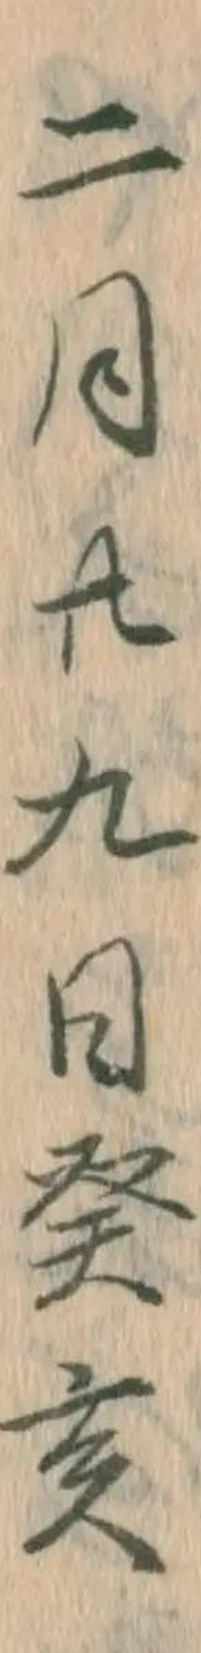二月廿九日癸亥
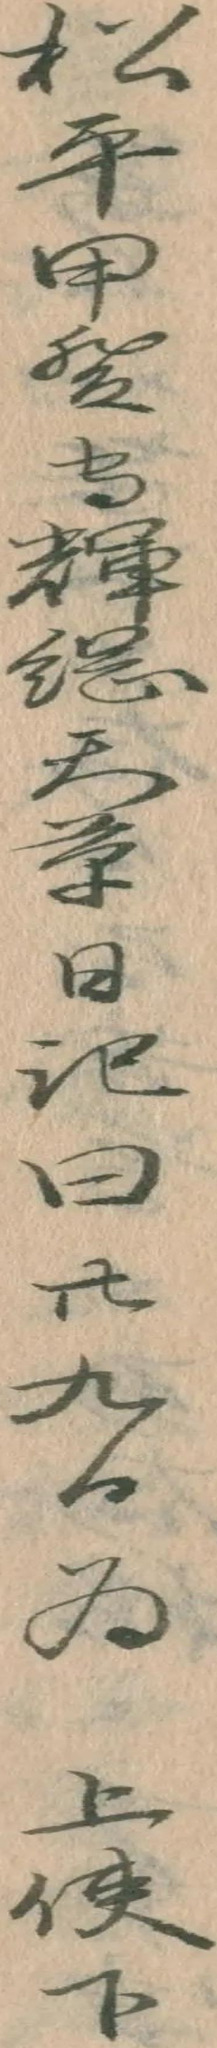松平甲斐守輝綱天草日記曰廿九日ゐ上使下
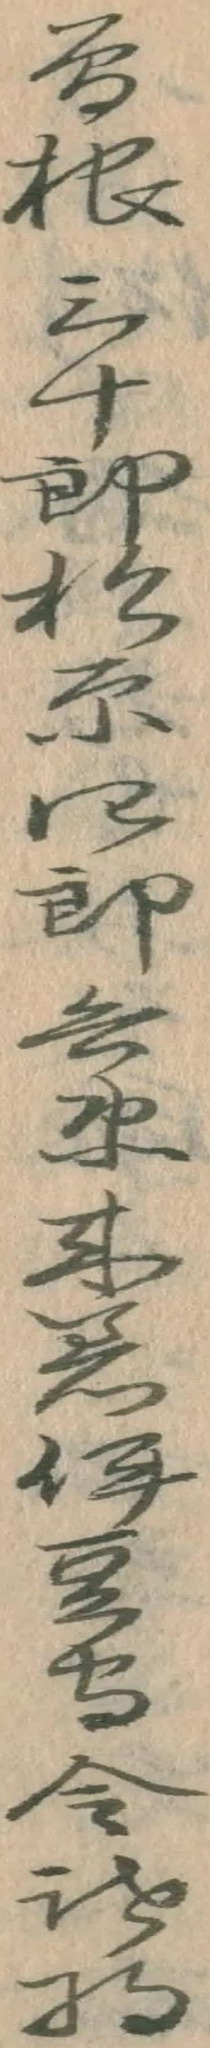曽根三十郎松原四郎兵衛来着伊豆守金諸将
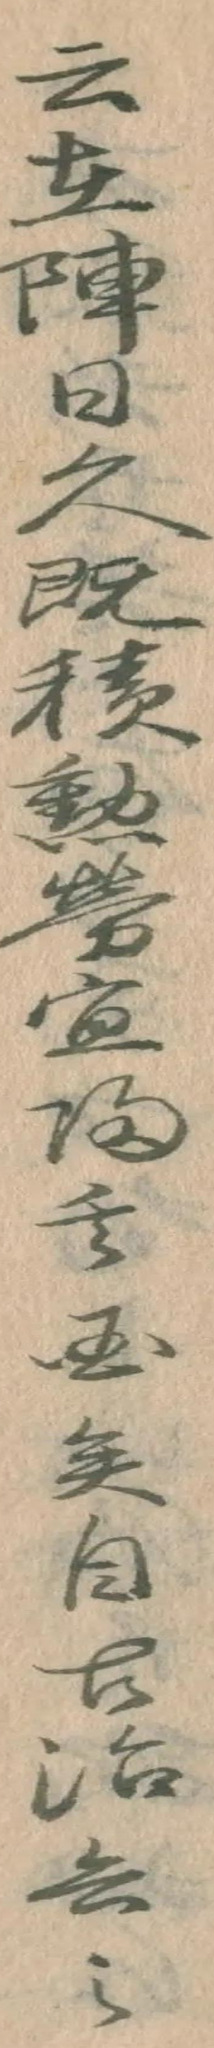云在陣日久既積勲労宣帰其国矣自古治兵之
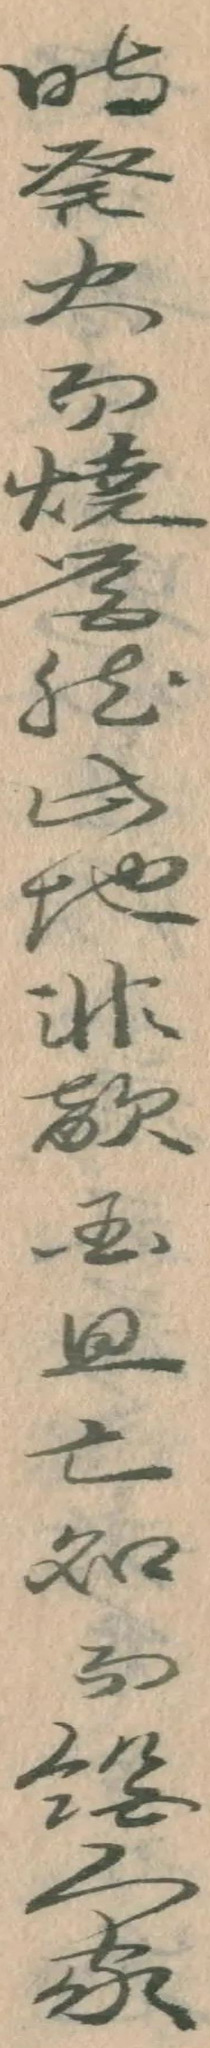時発火而焼営然此地非敵国且亡処而絶人家
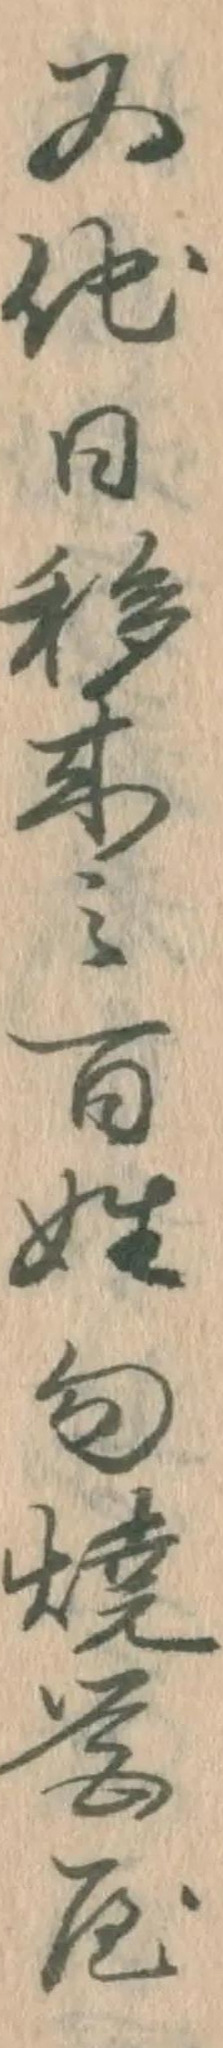ゐ他日移来之百姓勿焼営屋
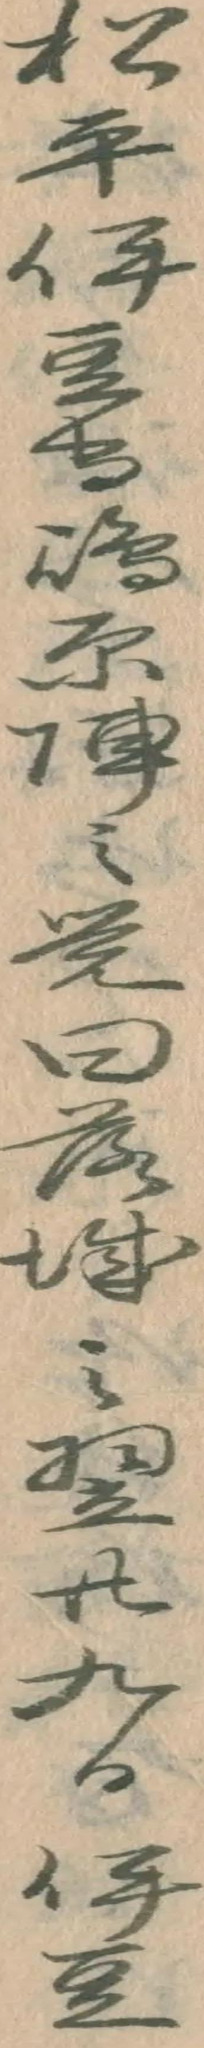松平伊豆守島原陣之覚曰落城之翌廿九日伊豆
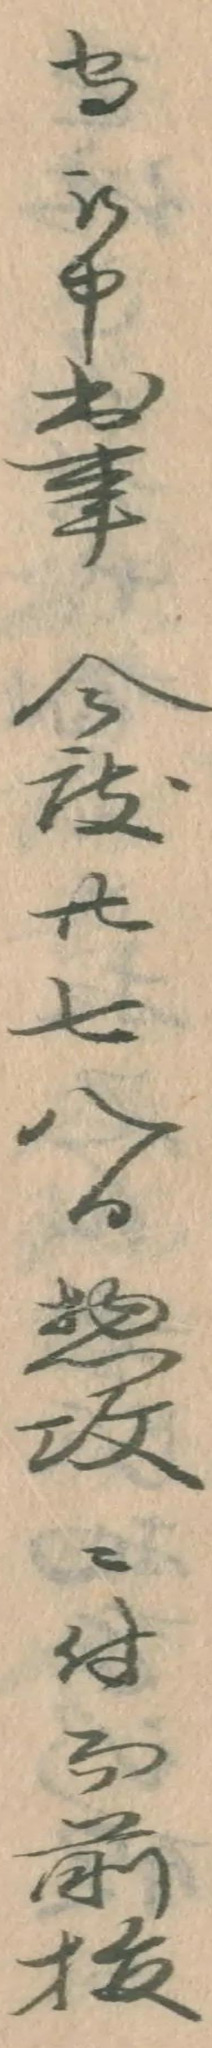神被申出亊今度廿七八日惣攻に付而前抜

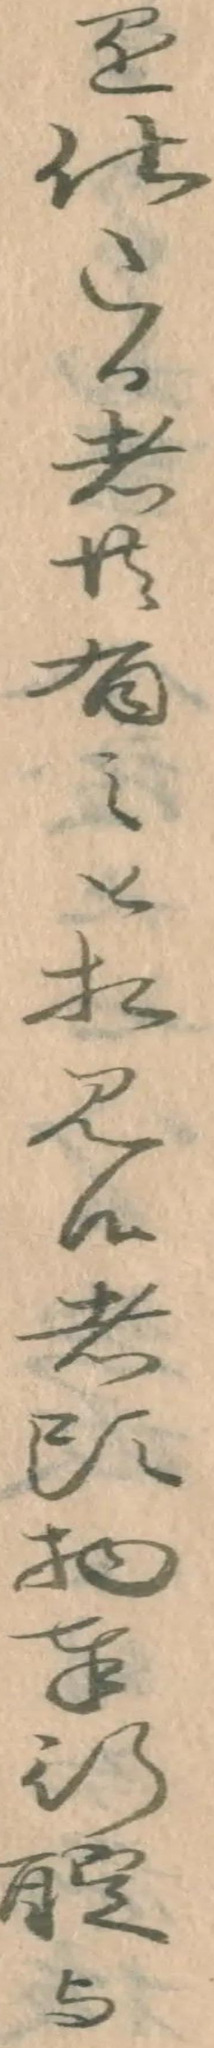懸仕たる者共有之と相見候者頭物奉行聢而
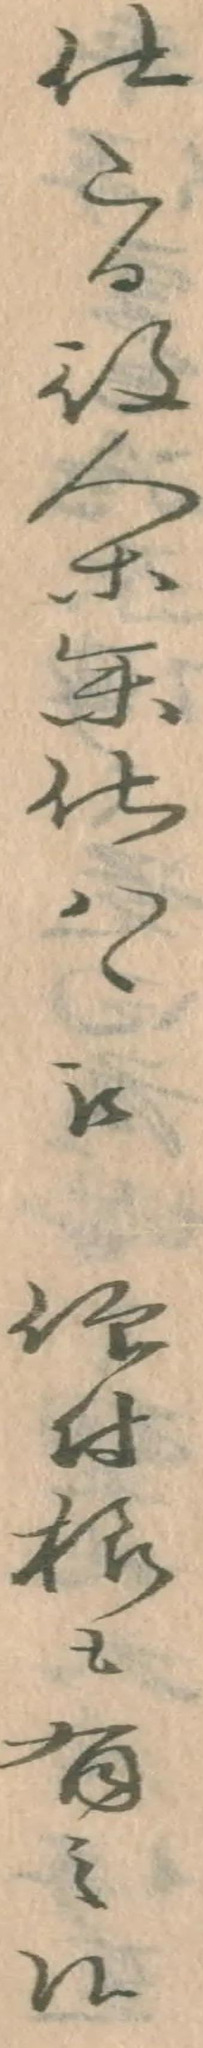仕たる役人等参仕はゝ被仰付様も有之候
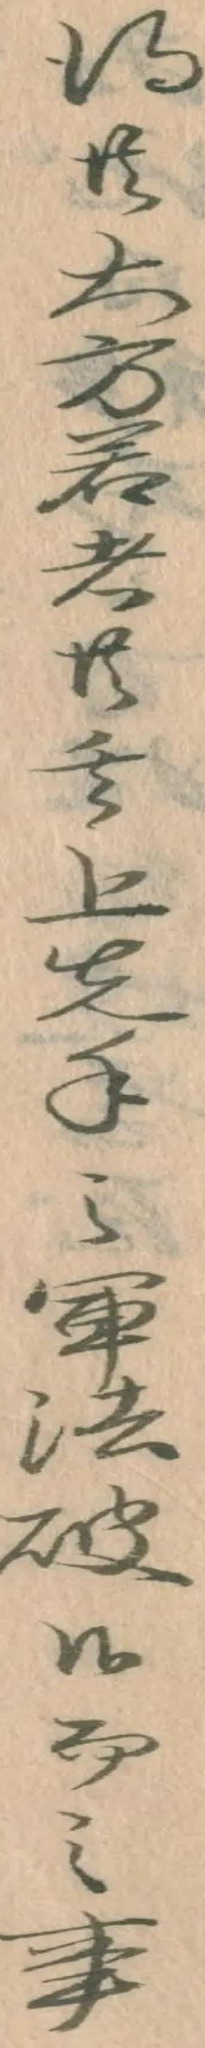得共大方若者共其上先手之軍法破候而之事
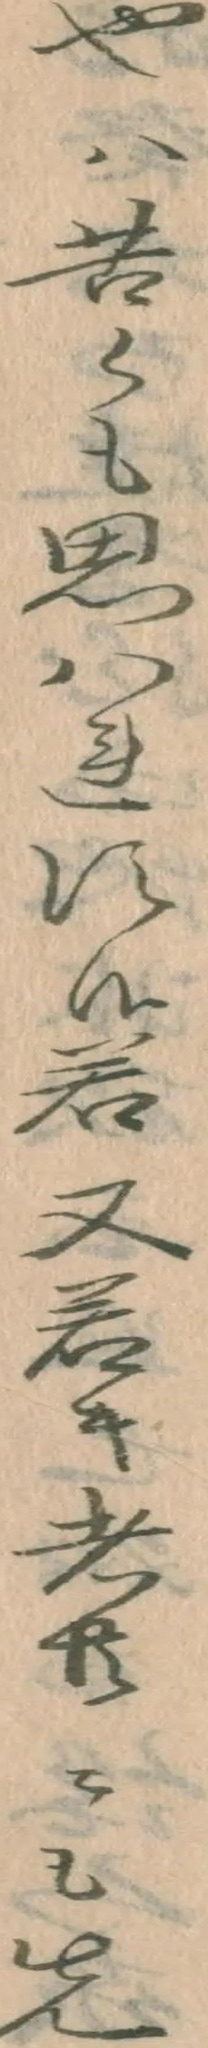也は苦くも思は連須候若又若き者共にも先
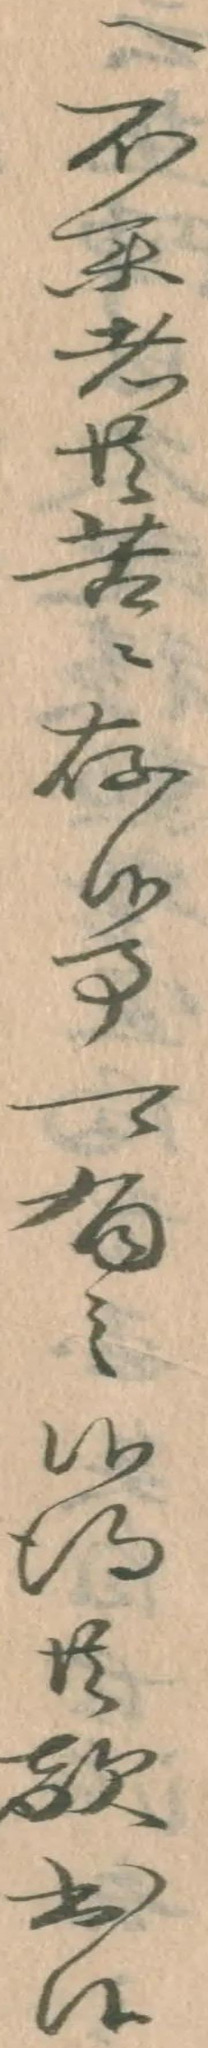へ不参者共苦に存候事可有之候得共敵出候
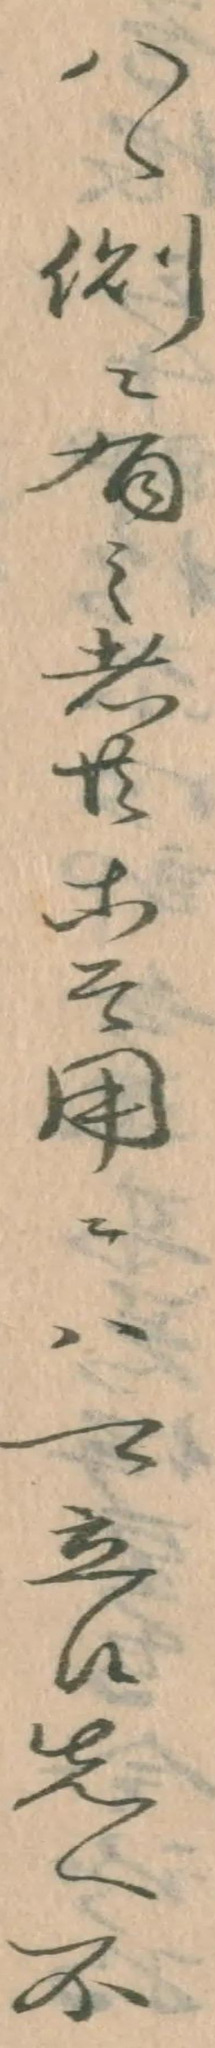はゝ例に有之者共等そ用には可立候先へ不
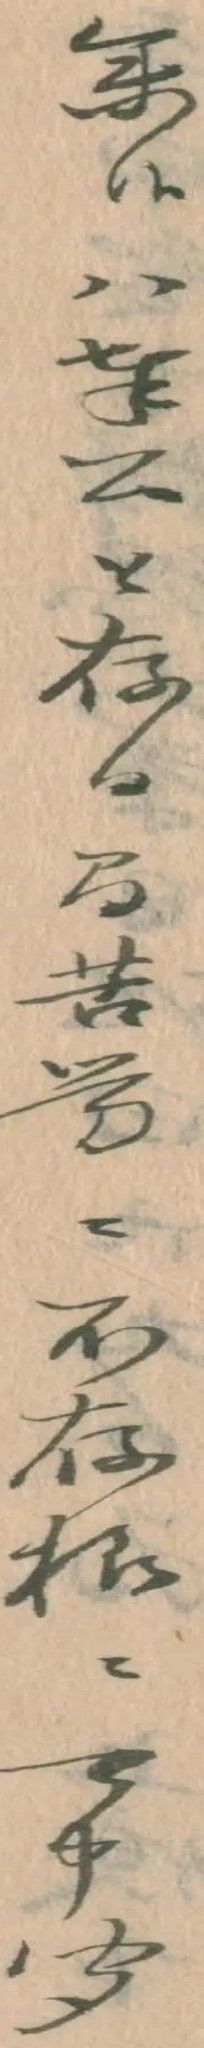参候は奉公と存る間苦労に不存様に可申聞
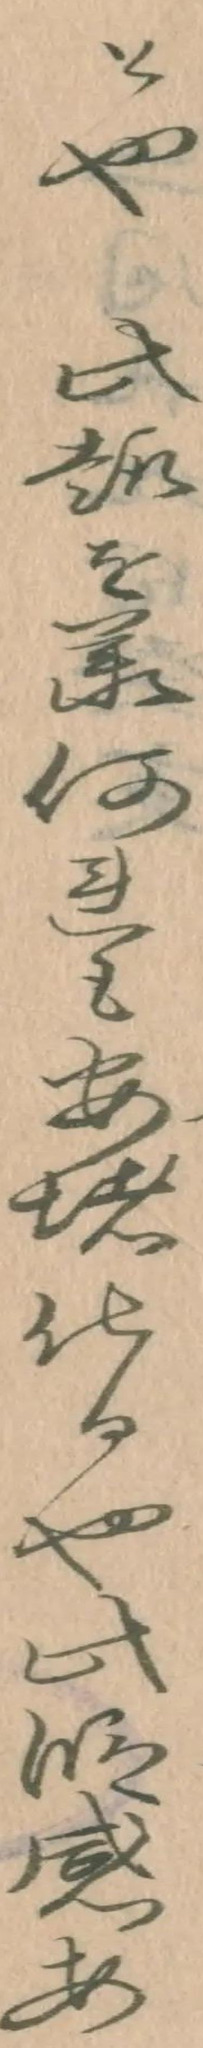と也此趣を承何連も安堵仕る也此段感あ
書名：切支丹御退治記 49巻. [9]
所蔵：国立国会図書館 National Diet Library, JAPAN
